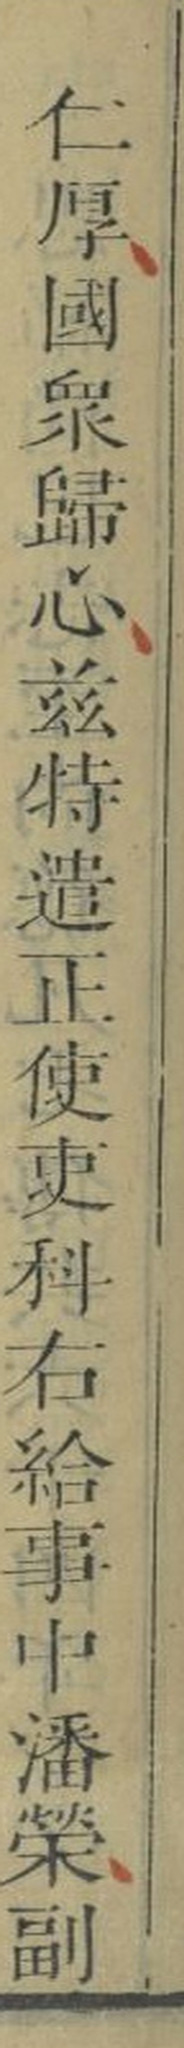仁厚国衆帰心茲特遣正使吏科右給事中潘栄副
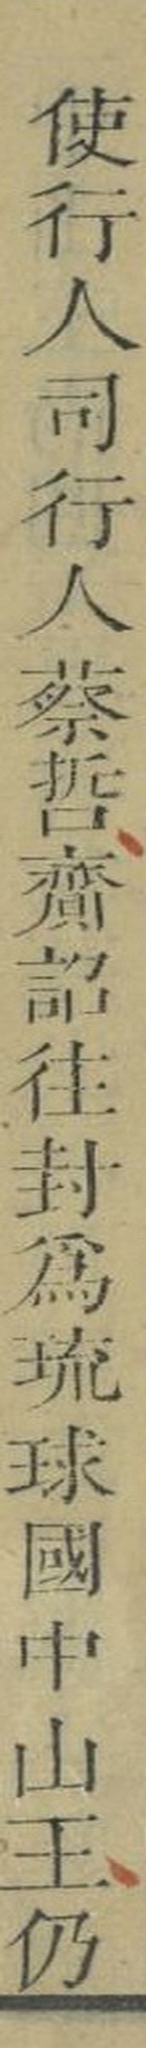使行人司行人蔡哲齎詔往封為琉球国中山王仍
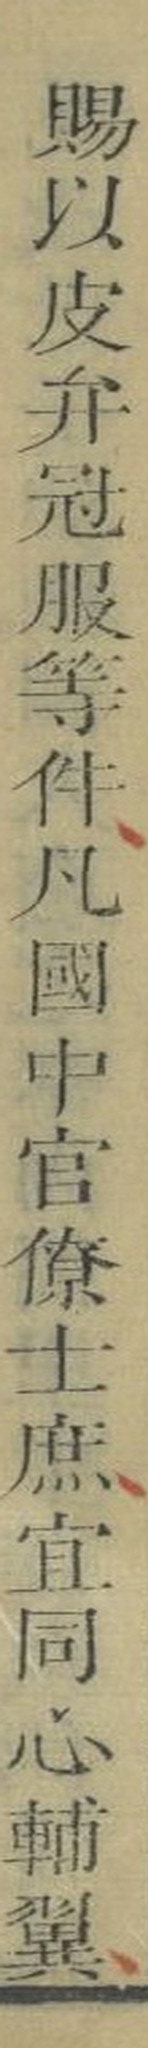賜以皮弁冠服等件凡国中官僚士庶宜同心輔翼
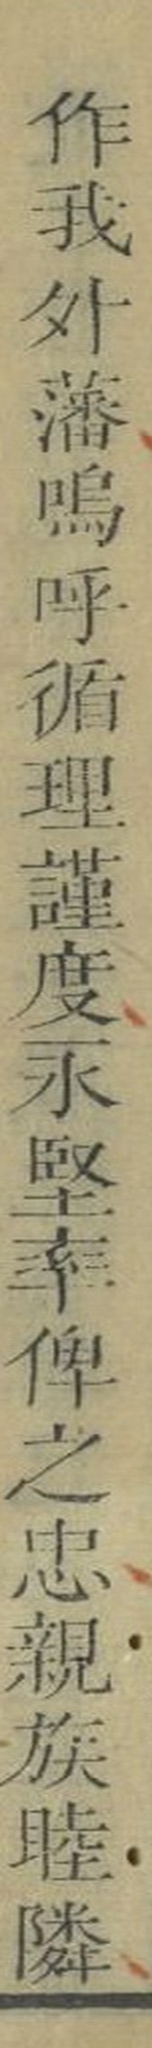作我外藩嗚呼循理謹度永堅率俾之忠親族睦隣
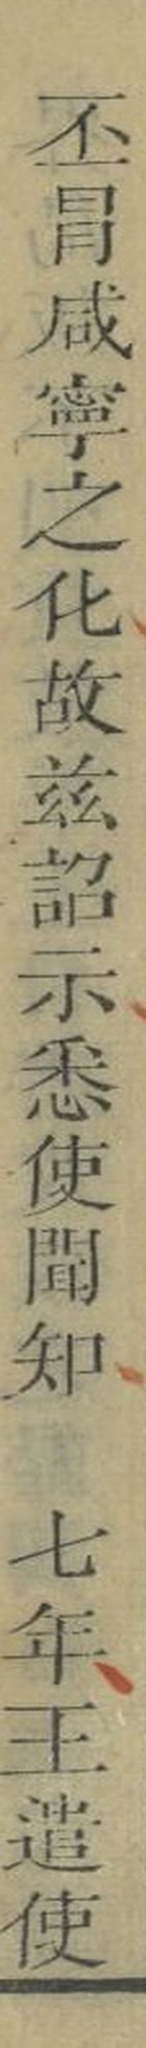丕冐咸寧之化故茲詔示悉使聞知七年王遣使
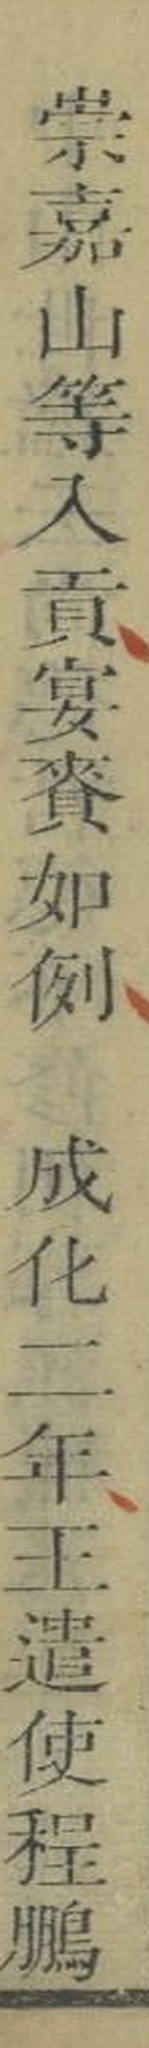崇嘉山等入貢宴賚如例成化二年王遣使程鵬
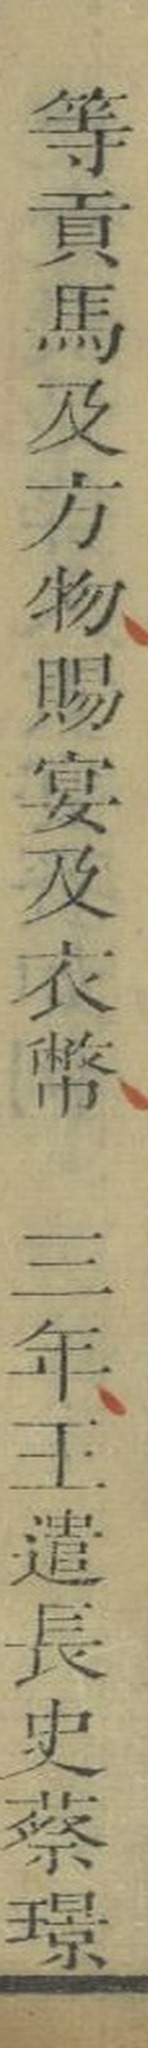等貢馬及方物賜宴及衣幣三年王遣長史蔡璟
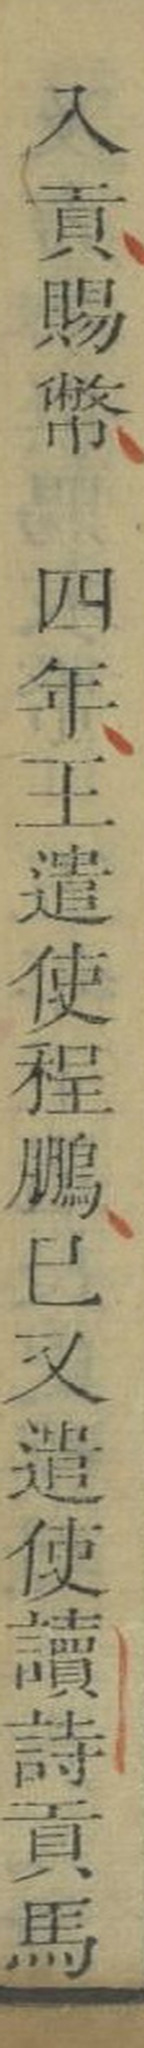入貢賜幣四年王遣使程鵬巳又遣使読詩貢馬

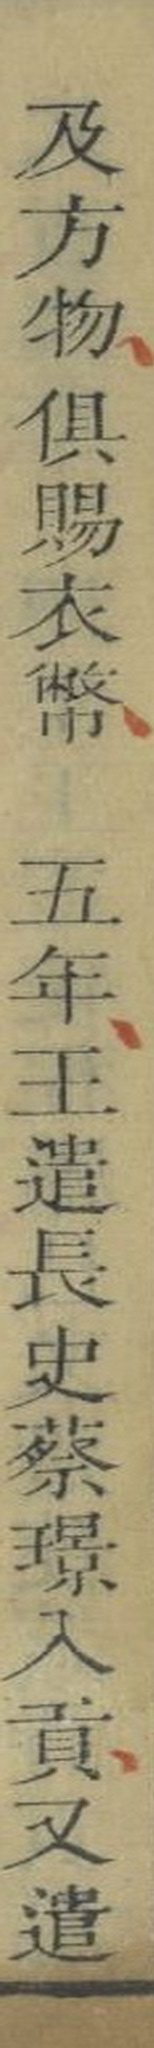及方物俱賜衣幣五年王遣長史蔡璟入貢又遣
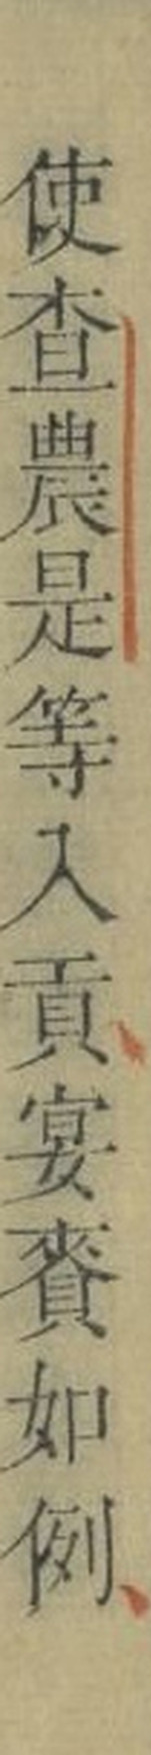使査農是等入貢宴賚如例
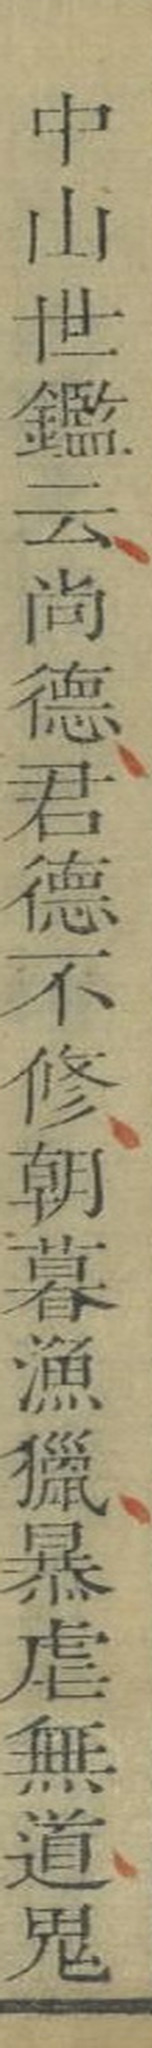中山世鑑云尚徳君徳不修朝暮漁猟暴虐無道鬼
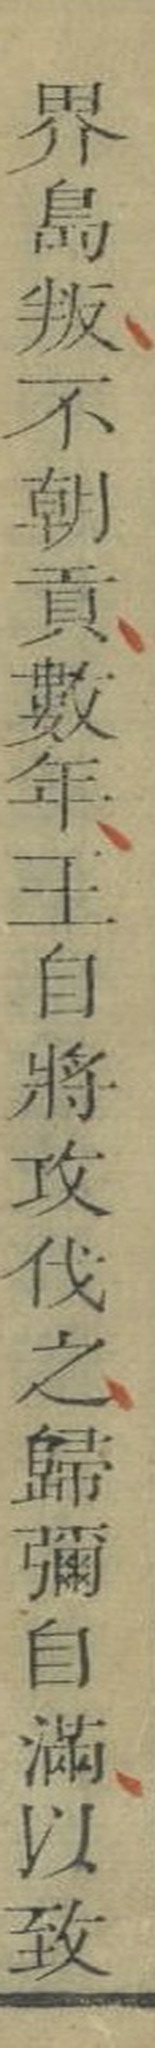界島叛不朝貢数年王自将攻伐之帰弥自満以致
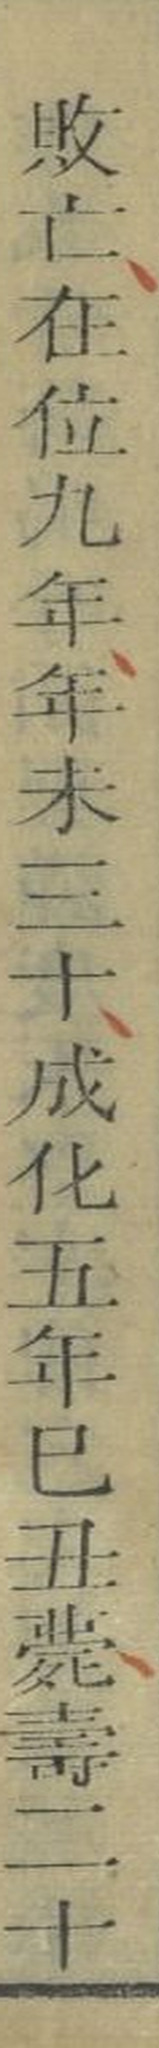敗亡在位九年年未三十成化五年巳丑薨寿二十
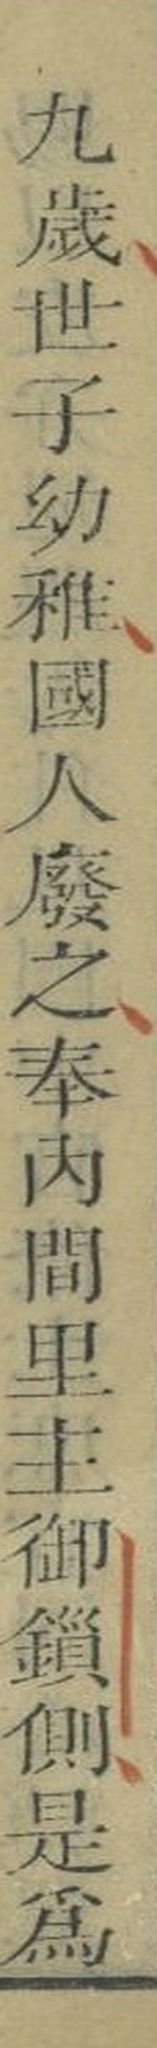九歳世子幼稚国人廃之奉内間里主御鎖側是為
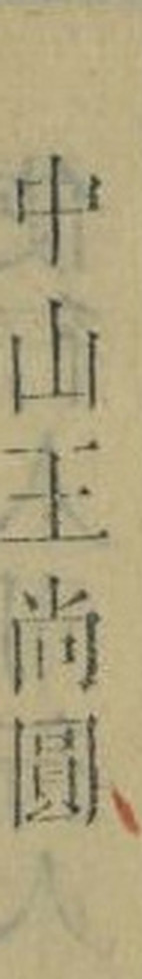中山王尚円
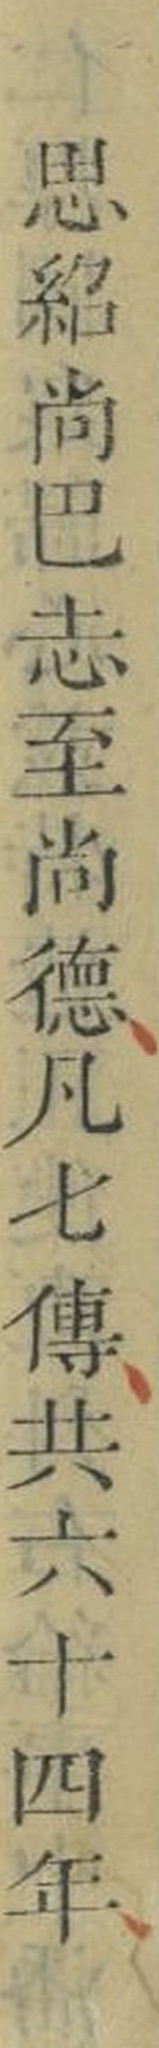思紹尚巴志至尚徳凡七伝共六十四年
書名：中山伝信録 巻三
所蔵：University of the Ryukyus Library
